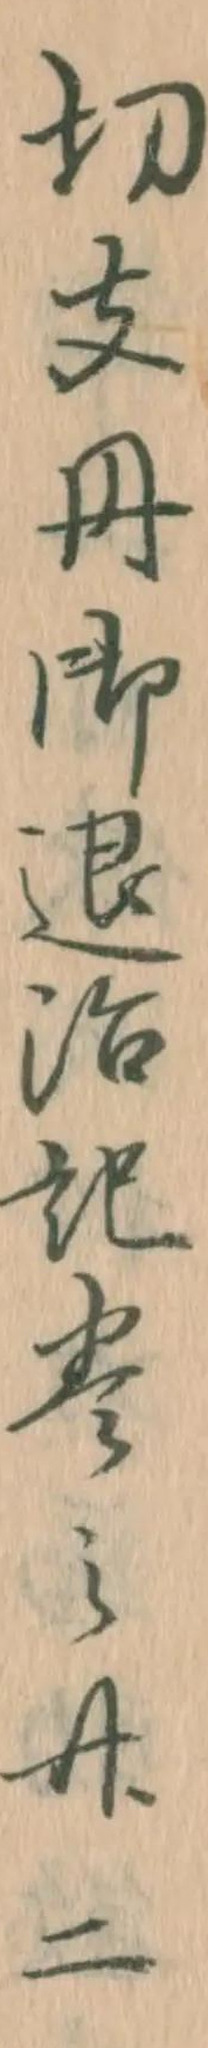切支丹御退治記巻之廿二
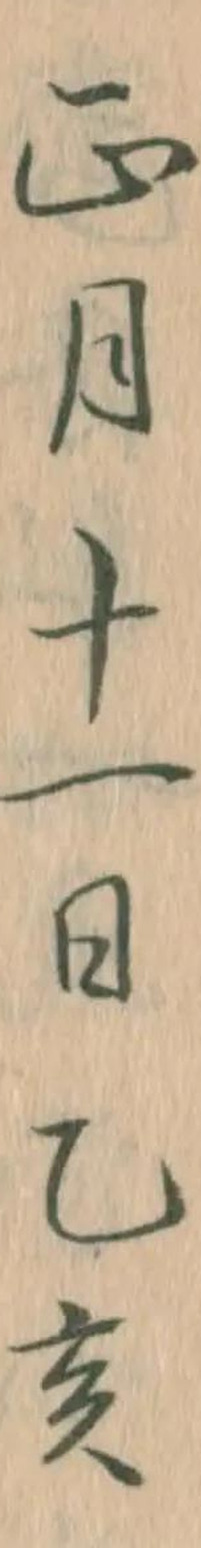正月十一日乙亥
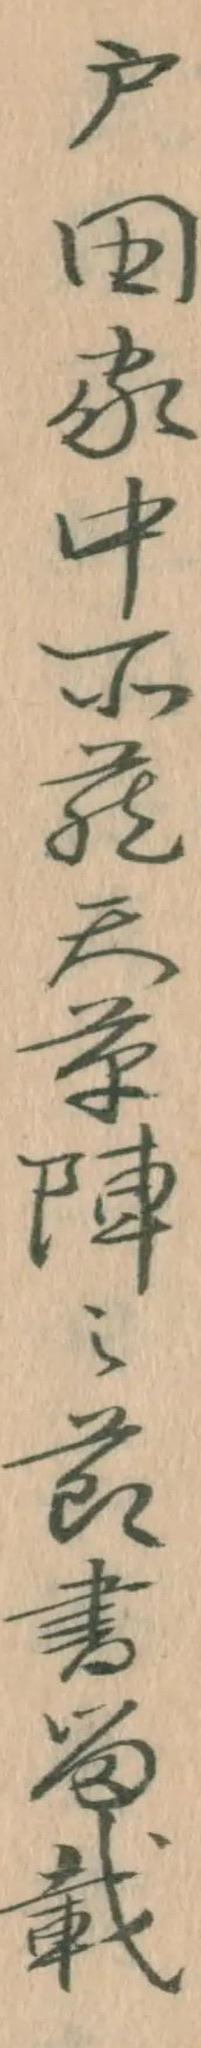戸田家中所蔵天草陣之節書留載
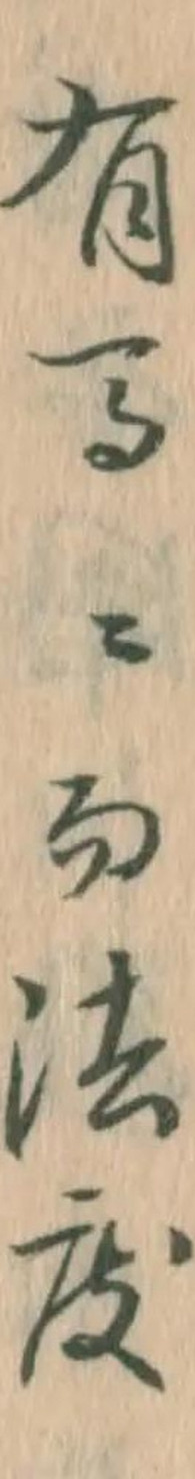有馬に而法度
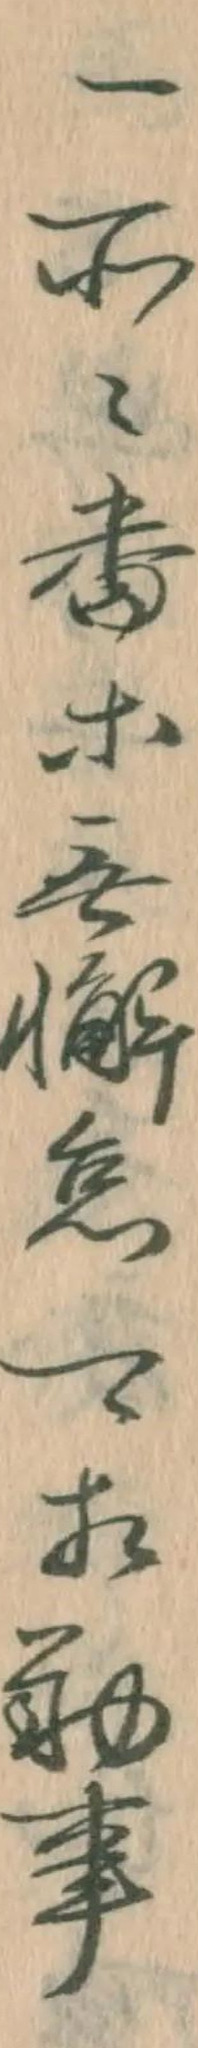一所に番等無懈怠可相勤事
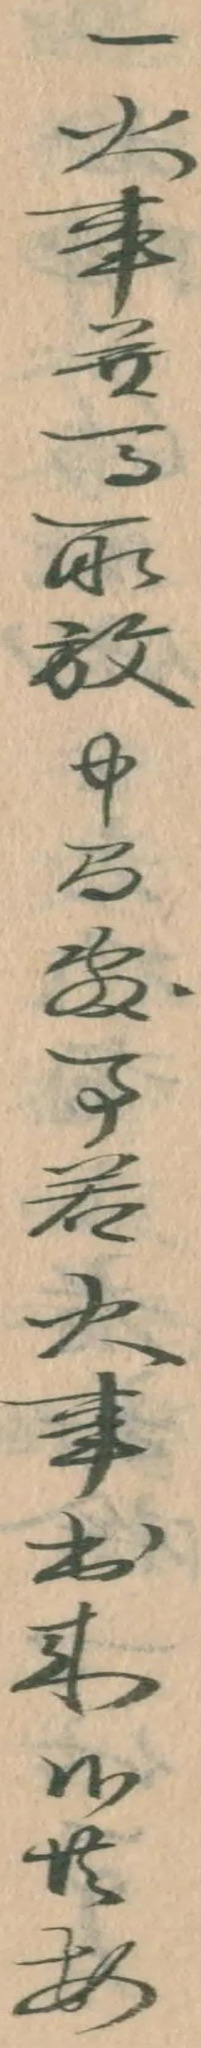一火事幷馬取放申間敷事若火事出来候共あ
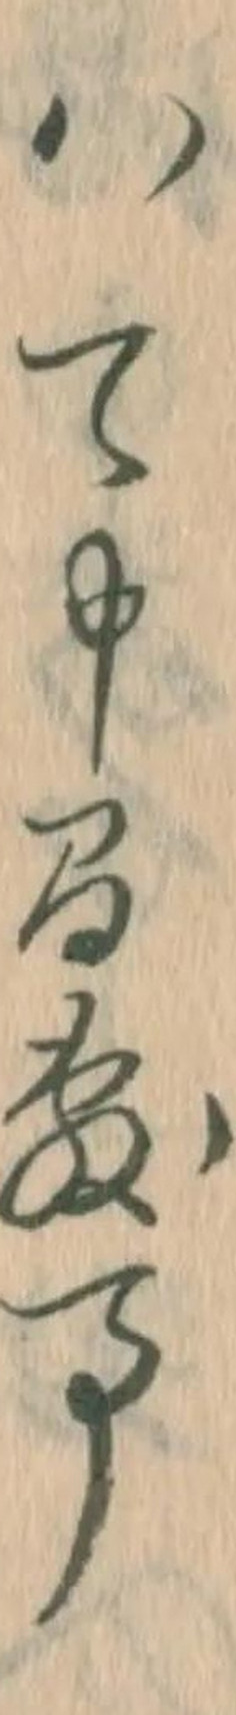はて申間敷事
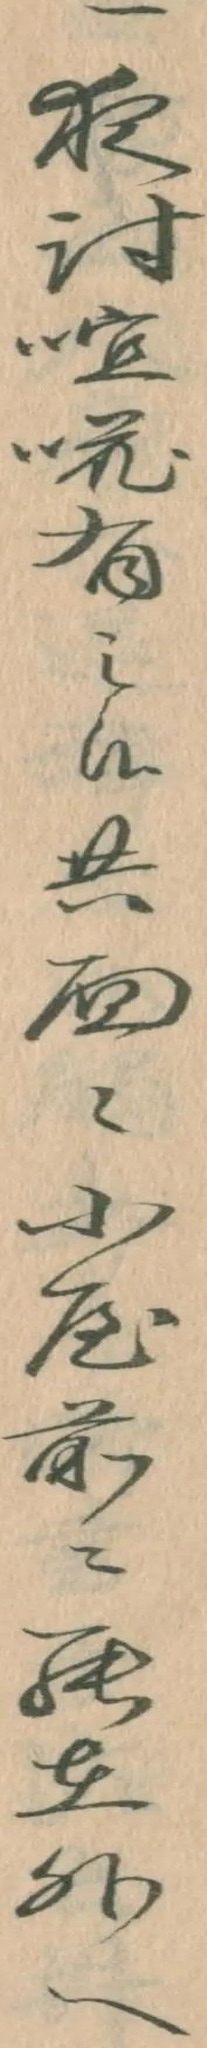一夜討喧嘩有之候共面々小屋前に罷在外へ
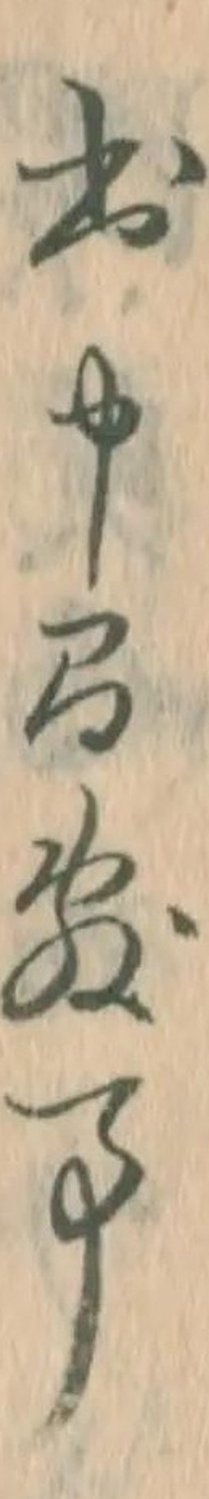出申間敷事

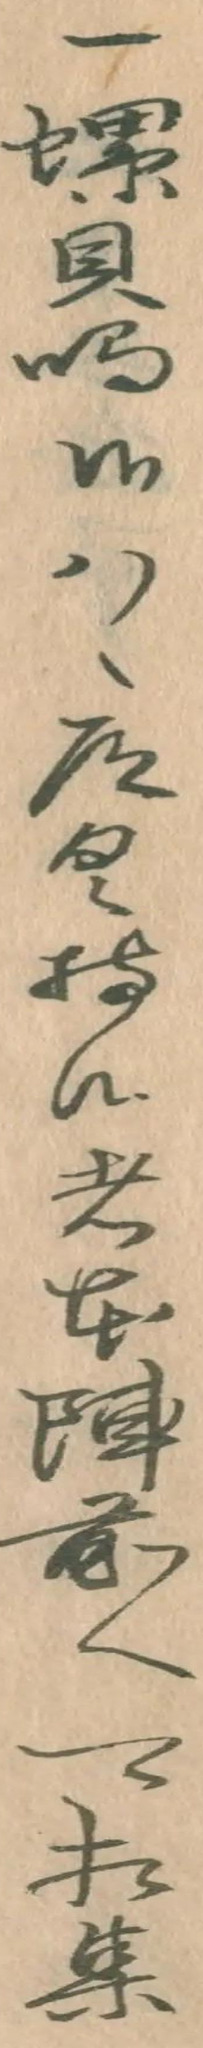一螺貝鳴候はゝ道具持候者本陣前へ可相集
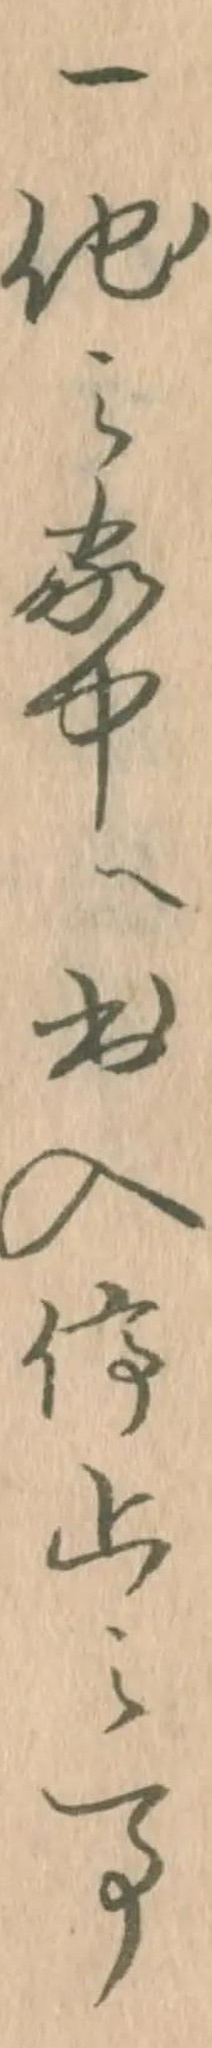一他之家中へ出入停止之事
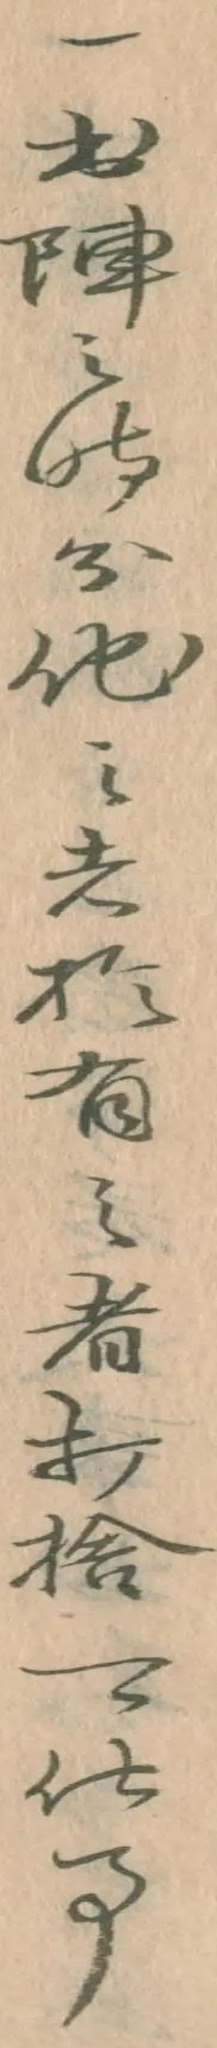一出陣之時分他之者於有之者打捨可仕事
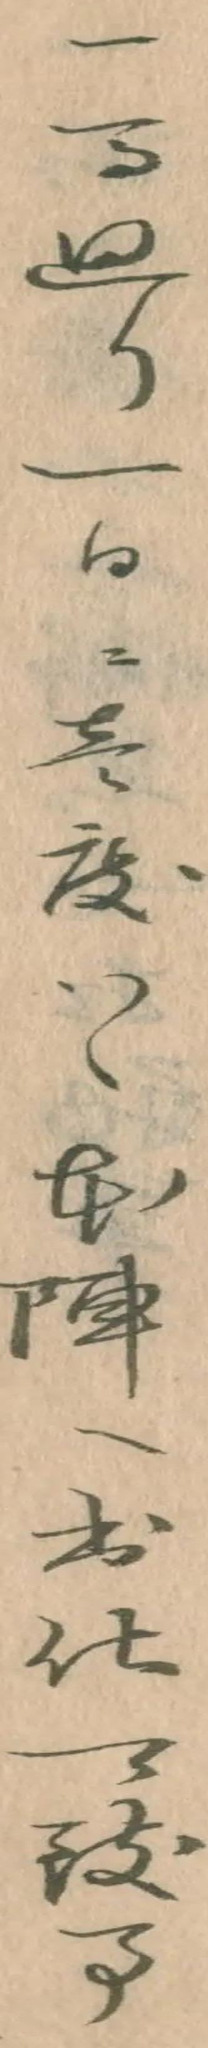一馬廻り一日に壱度つゝ本陣へ出仕可致事
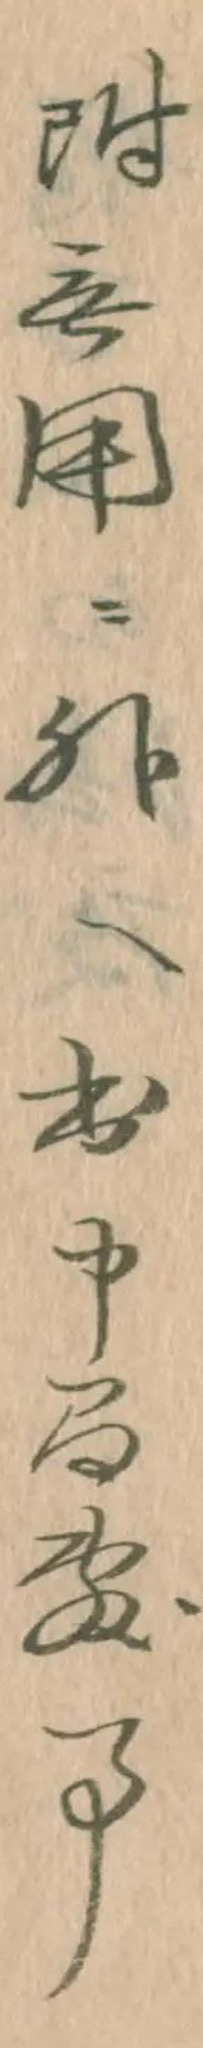附無用に外へ出申間敷事
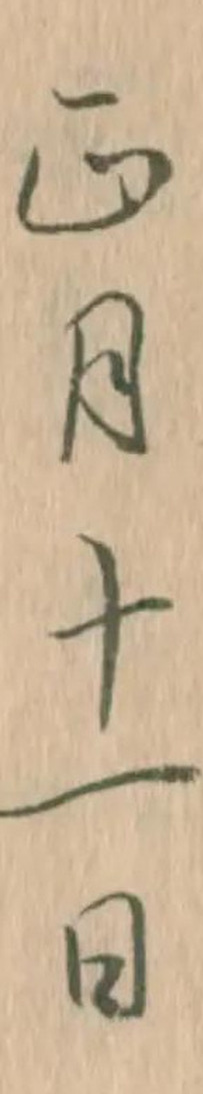正月十一日
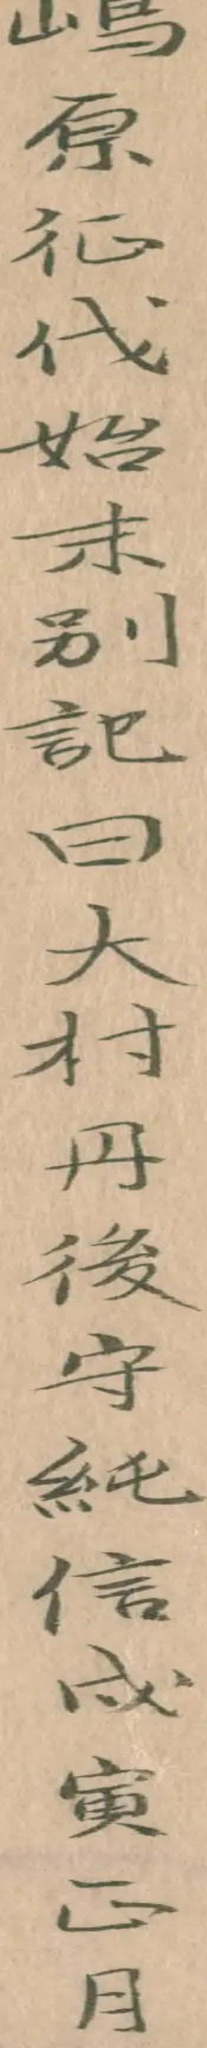島原征伐始末別記曰大村丹後守純信戌寅正月
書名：切支丹御退治記 49巻. [6]
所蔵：国立国会図書館 National Diet Library, JAPAN
